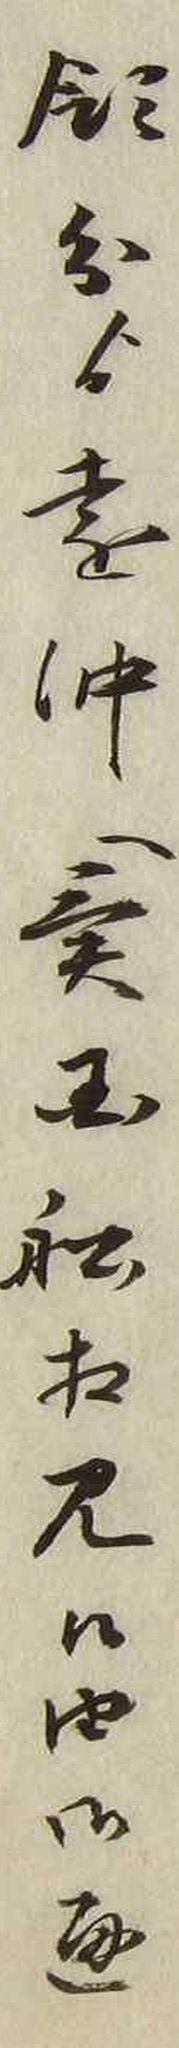領分より遠沖へ異国船相見候由御通

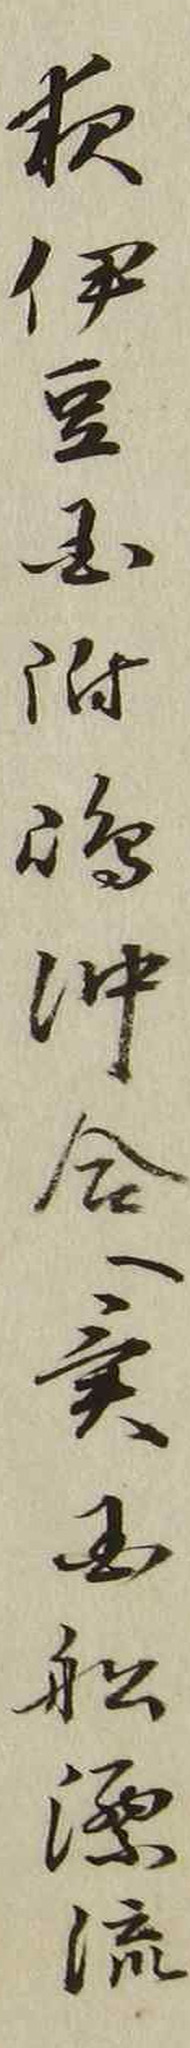夜伊豆附き埼沖合へ異国船漂流
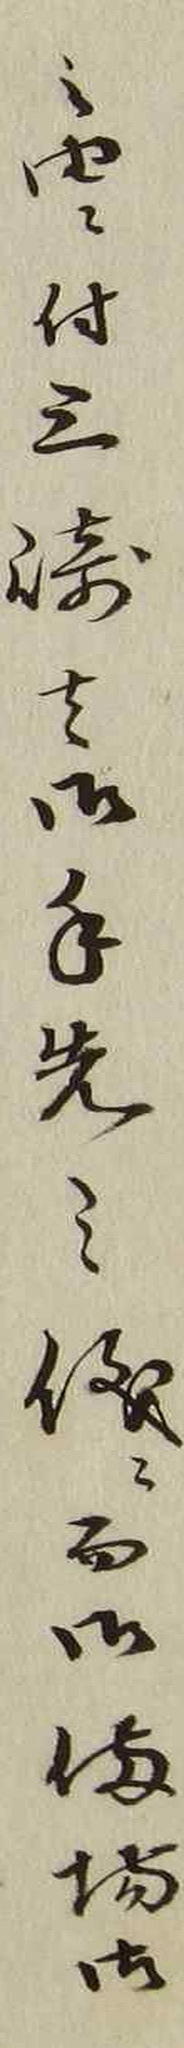之由ニ付き三崎は御手先之ぎニて御備え場御
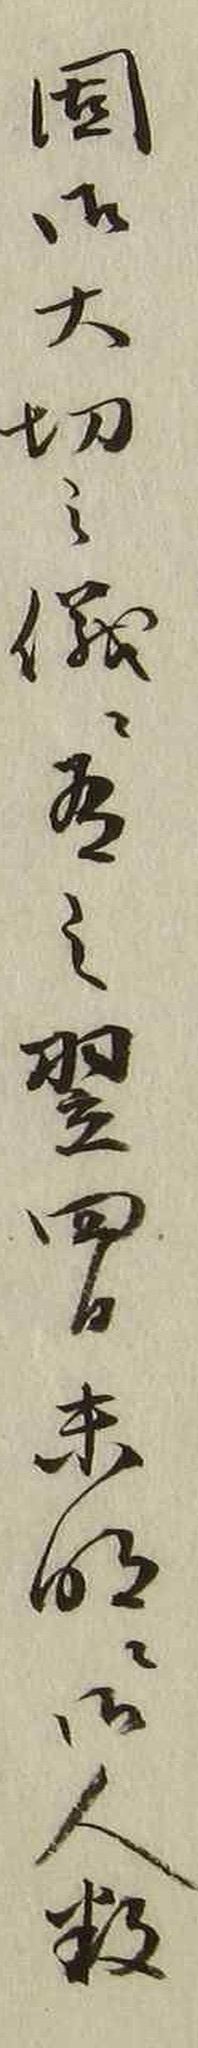固め御大切之儀ニ有之翌四日未明御人数
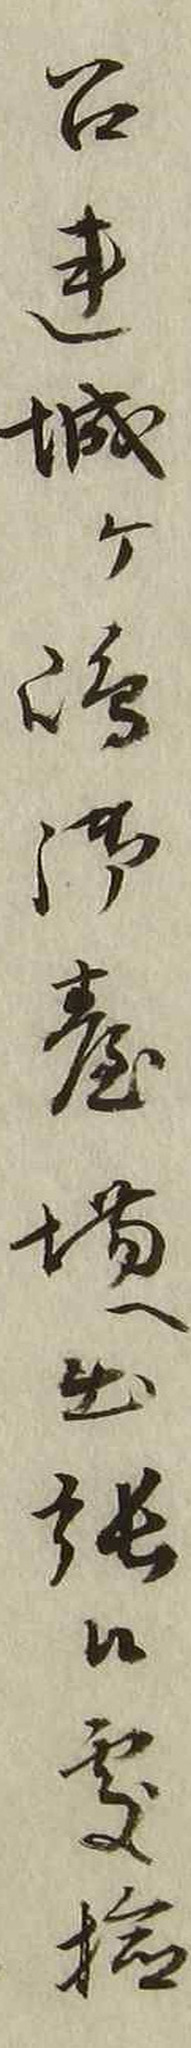め召連れ城ケ崎御台場へ出張候処抑
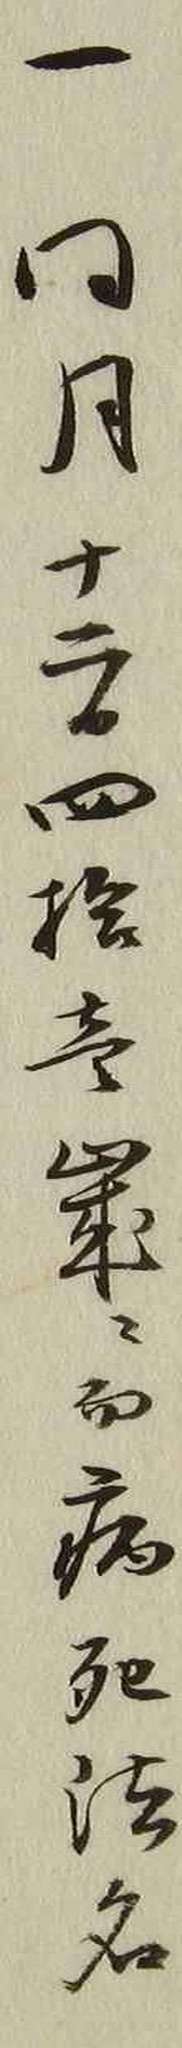一同月十二日四拾壱歳ニて病死法名
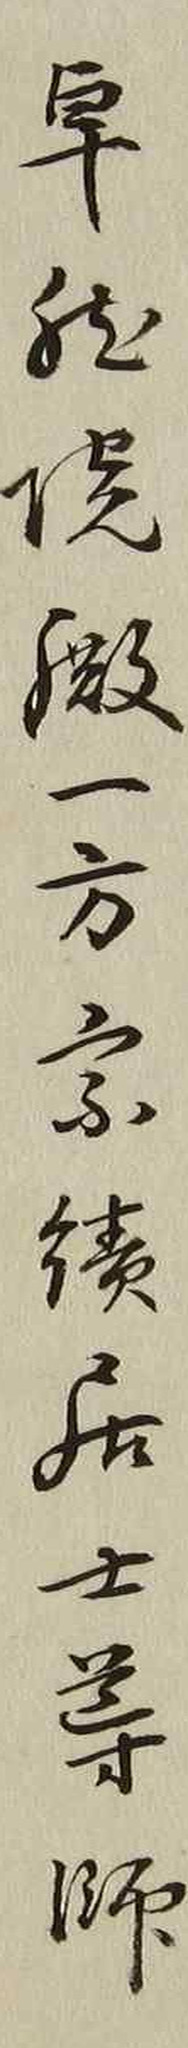卓然院殿一方宗続居士導師
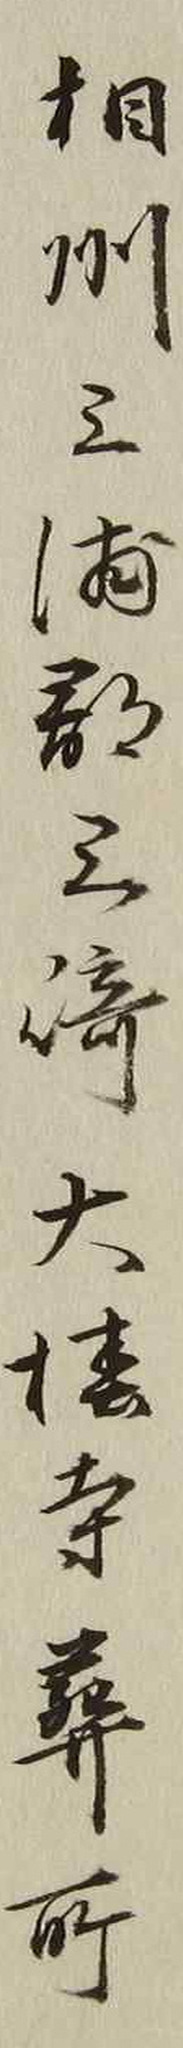相州三浦郡三崎大椿寺葬所
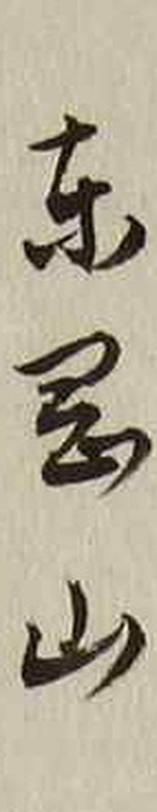東岡山
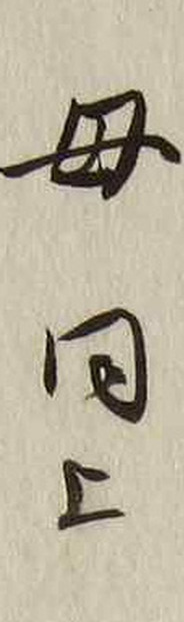母同上
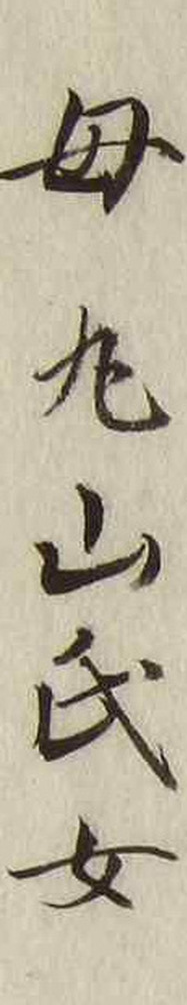母丸山氏女

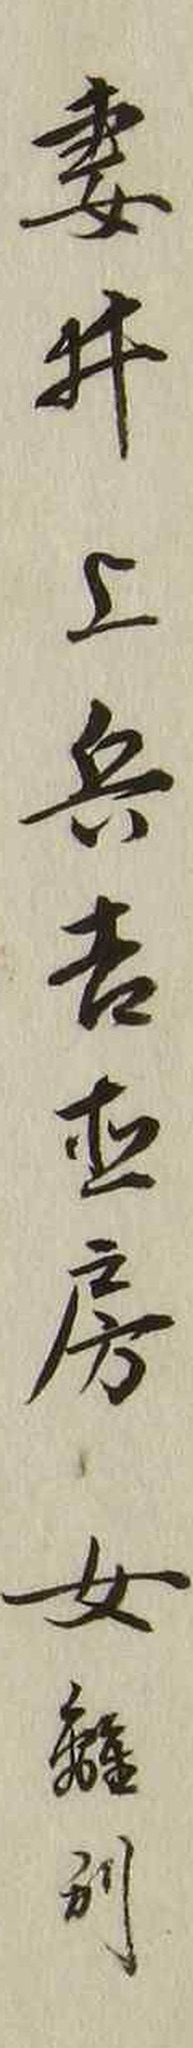妻井上兵吉直房女離別
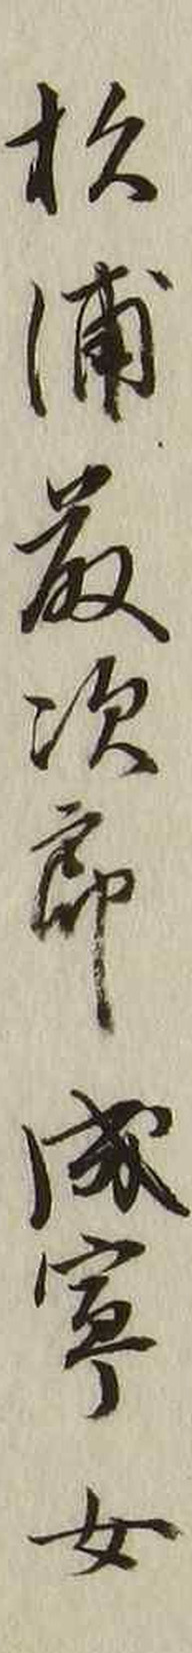杉浦藤次郎成寧女
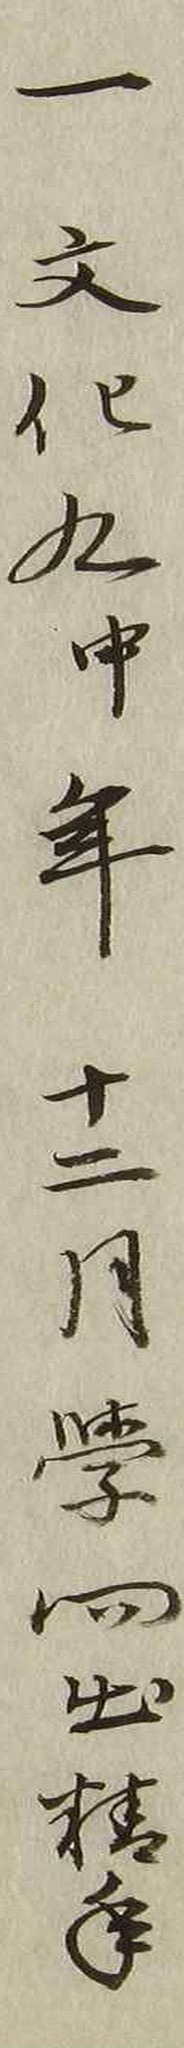一文化九申年十二月月学問出精年
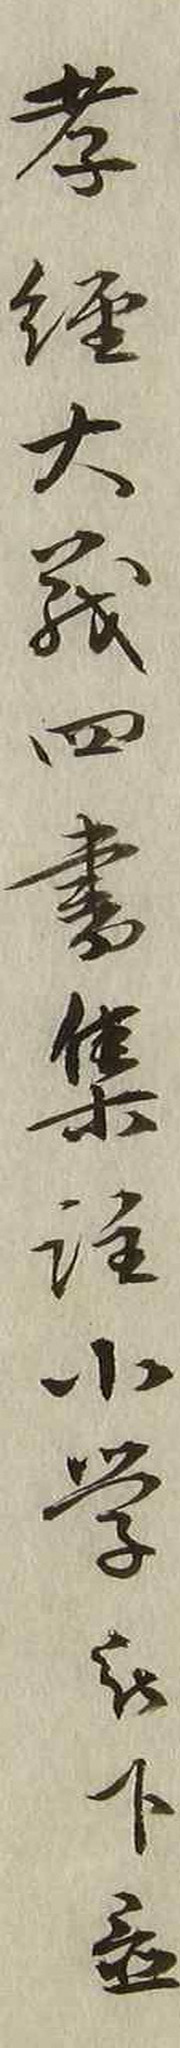孝経大義四書集注小学下し置かれ
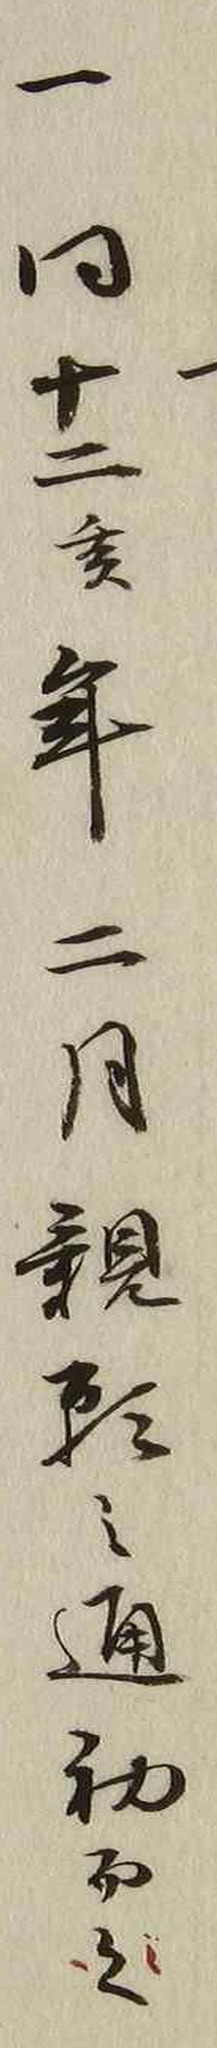一同十二亥年二月親願い之通初めて之
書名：諸士系譜　巻之16　い之部16
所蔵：会津若松市立会津図書館
